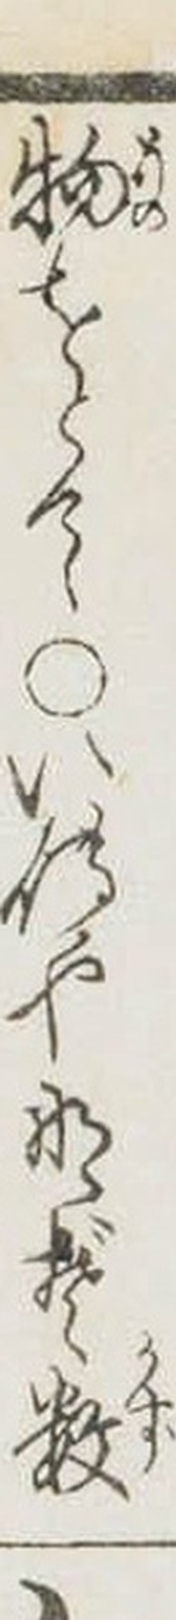物をとて○いてやなぞ数
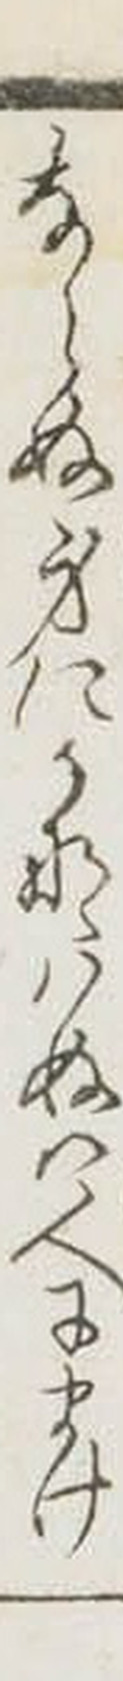ならぬ身にかなはぬは人にまけ
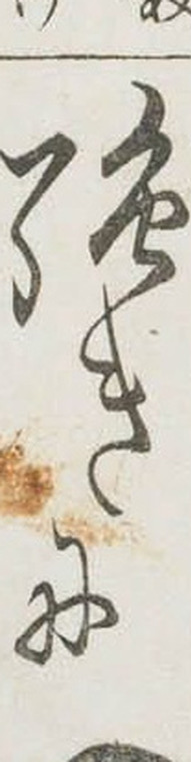強きに
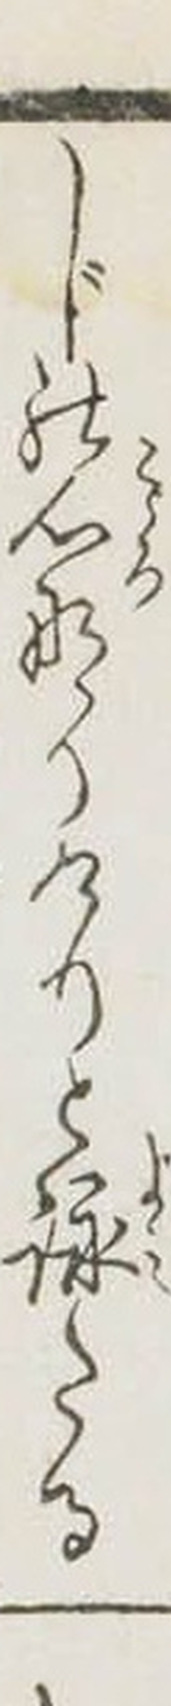じの心なりけりと詠たる
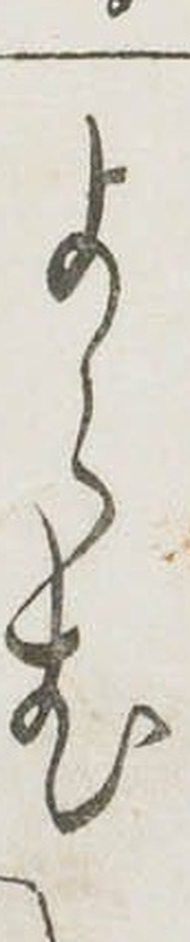よらむ
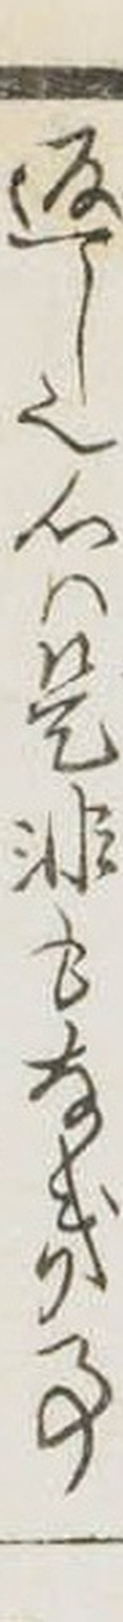返し也心は是非もなき事
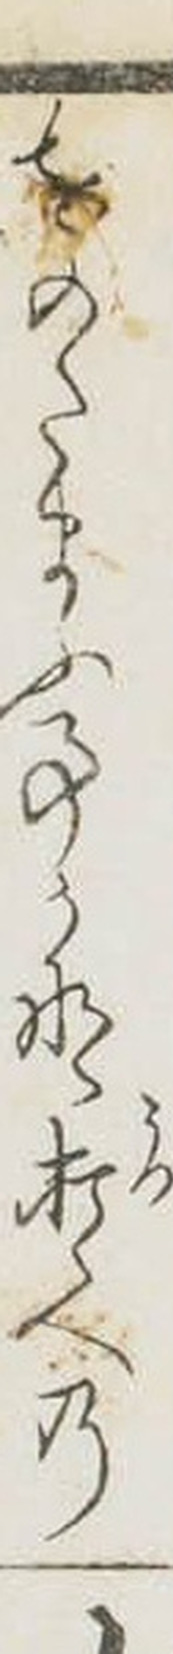をのたまふ事かな打人の
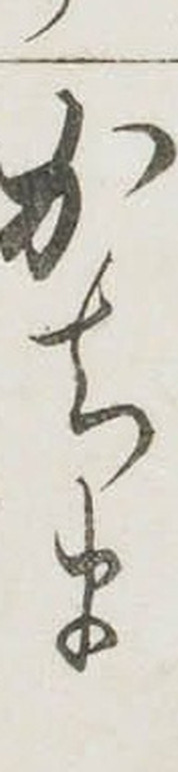かちま
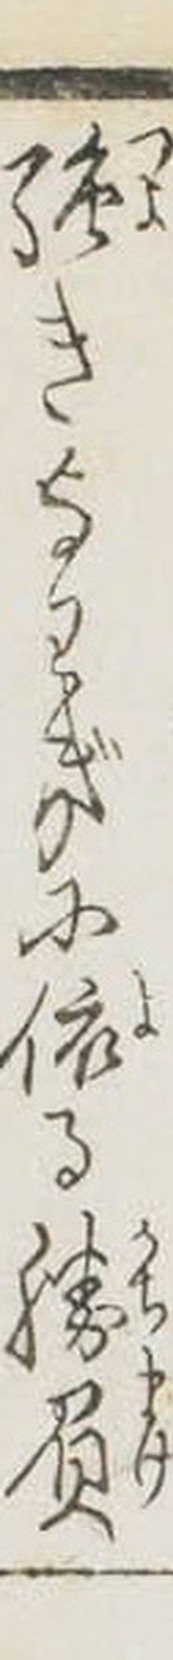強きよわぎに依る勝負
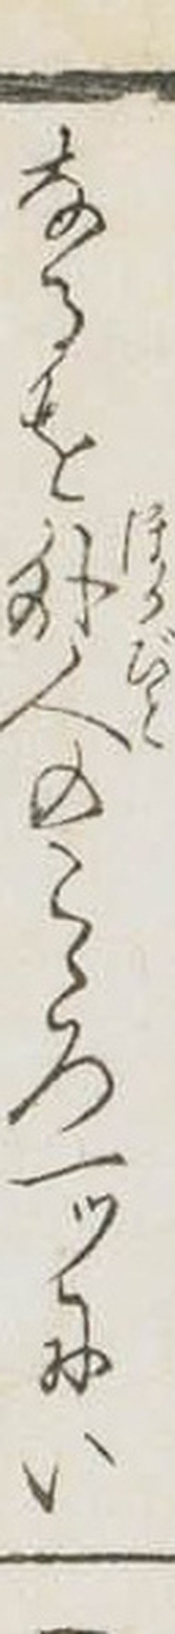なるを外人のこゝろ一ッにい
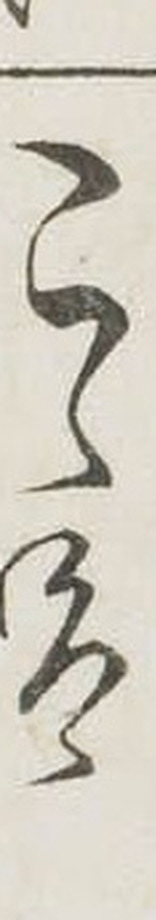こゝろ
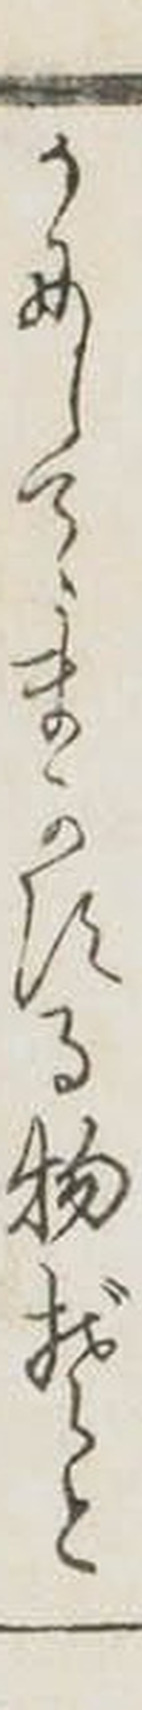かにしてまかする物ぞと
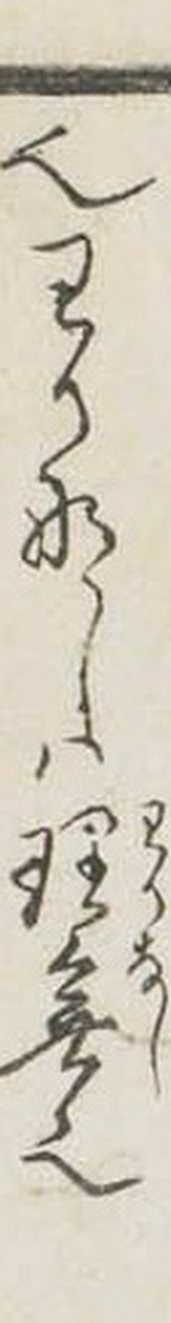也わりなしは理無也
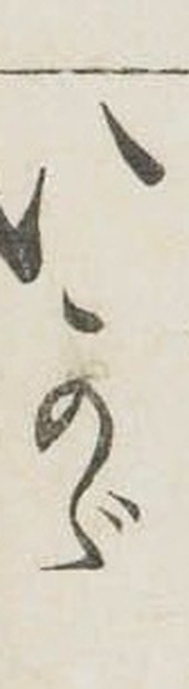いかゞ
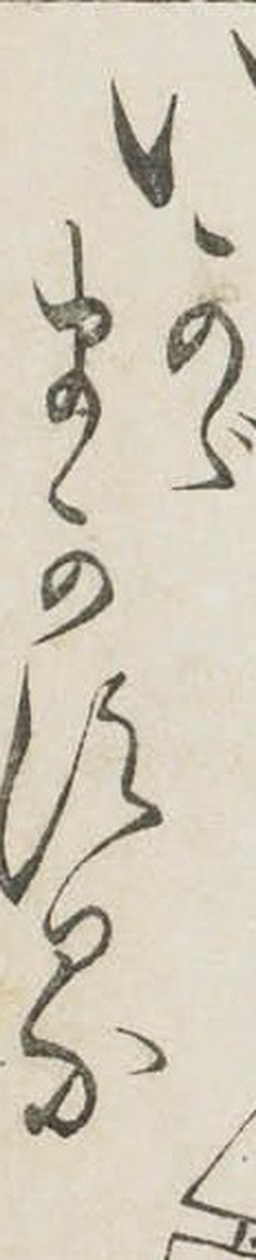まかする

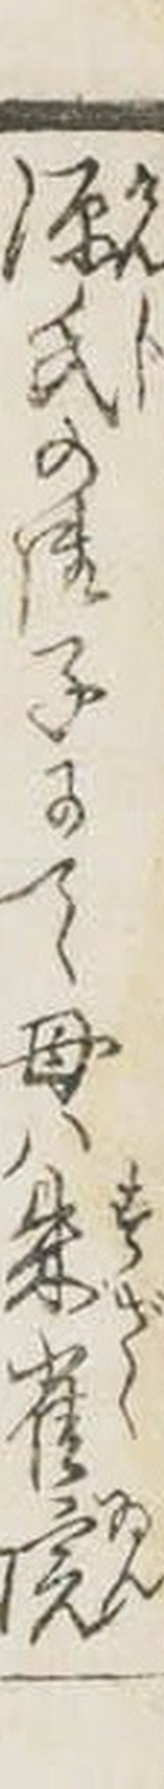源氏の御子にて母は朱雀院
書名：源氏百人一首
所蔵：東京学芸大学教育コンテンツアーカイブ
